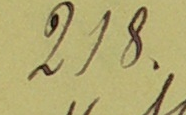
218
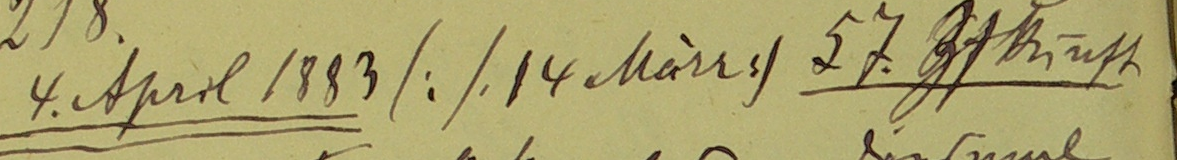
4. April 1883 (: 14 März. ) 57. Zusammenkunft
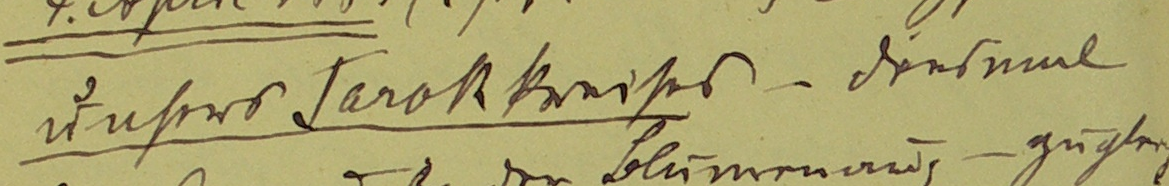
unseres Tarokkreises.- diesmal
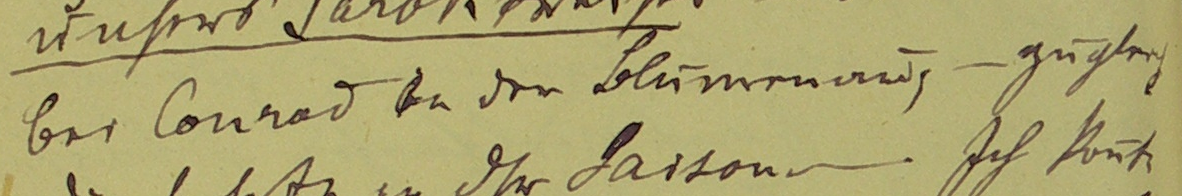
bei Conrad in der Blumenau,- zugleich
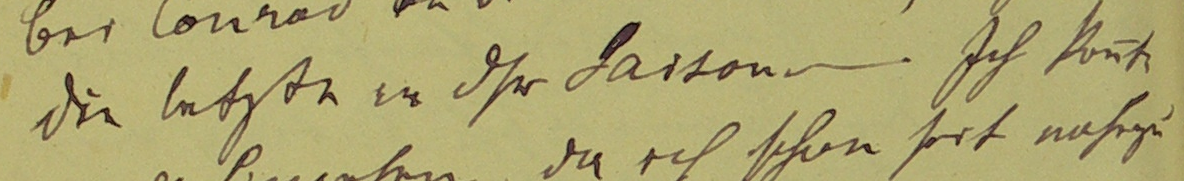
die letzte in dieser Saison.- Ich konnte
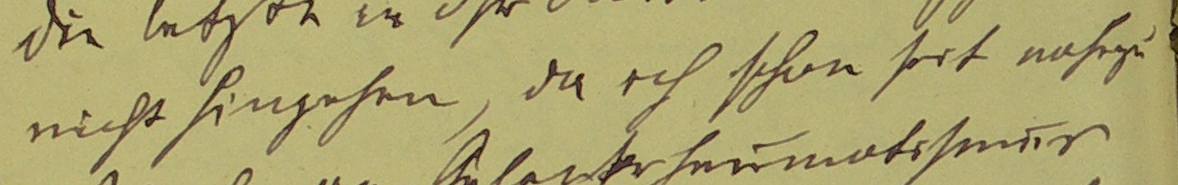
nicht hingehen, da ich schon seit nahezu
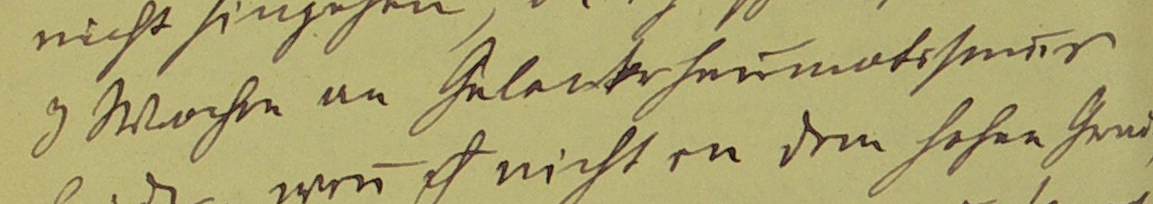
3 Wochen an Gelenkrheumatismus
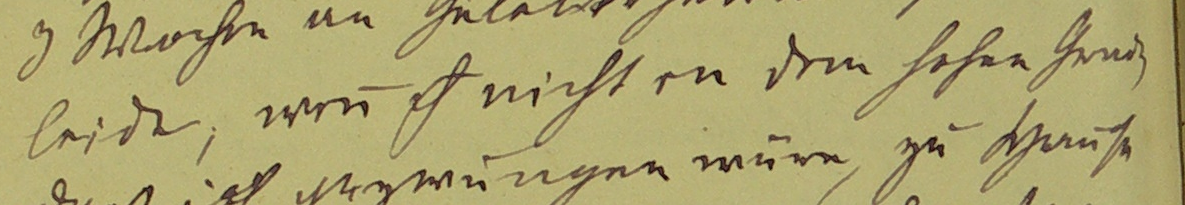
leide, wenn auch nicht in dem hohen Grade,
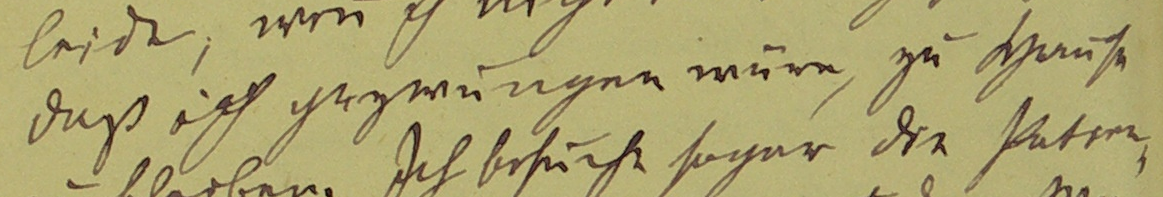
daß ich gezwungen wäre zu Hause
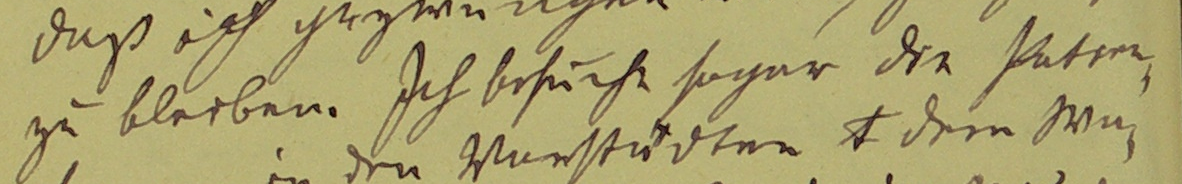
zu bleiben. Ich besuche sogar die Patien¬
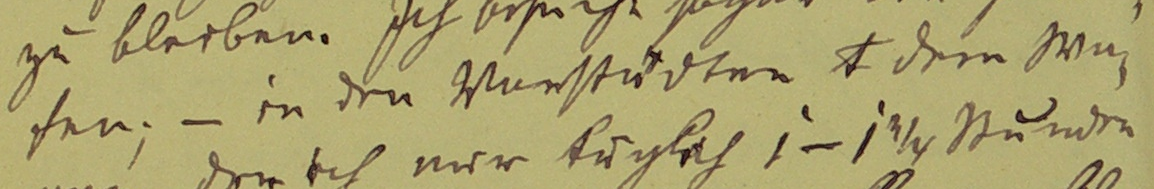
ten;- in den Vorstädten mit dem Wa¬
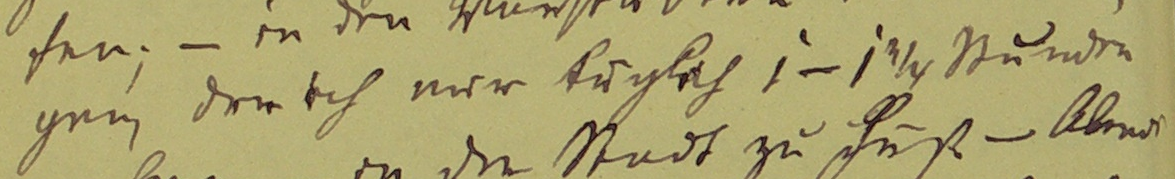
gen, den ich mir täglich 1-1.3/4 Stunden
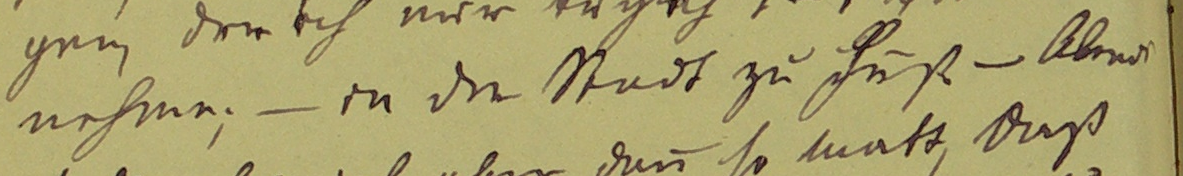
nehme;--in der Stadt zu Fuß - Abends
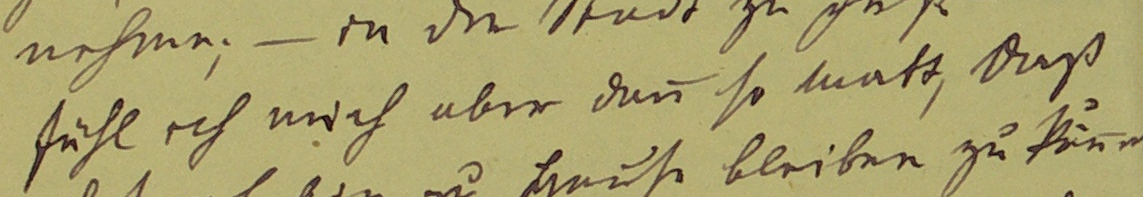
fühle ich mich aber dann so matt, daß
